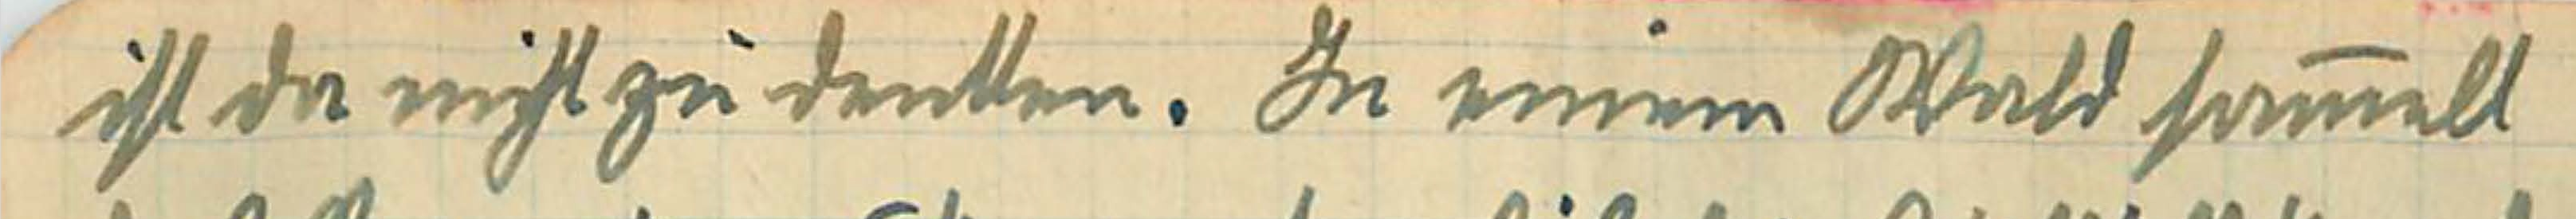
ist da nicht zu denken. In einem Wald sammelt
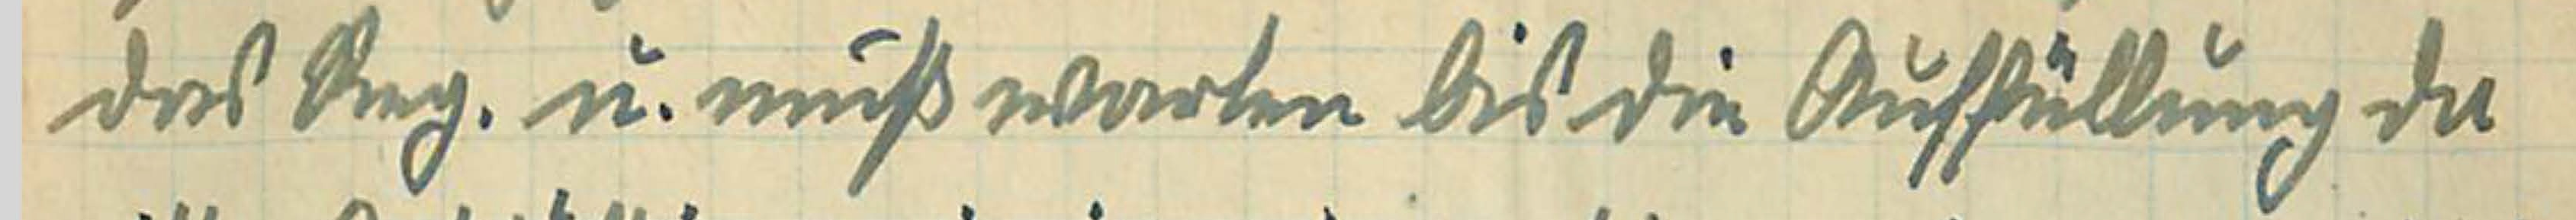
das Reg. u. muß warten bis die Auffüllung da
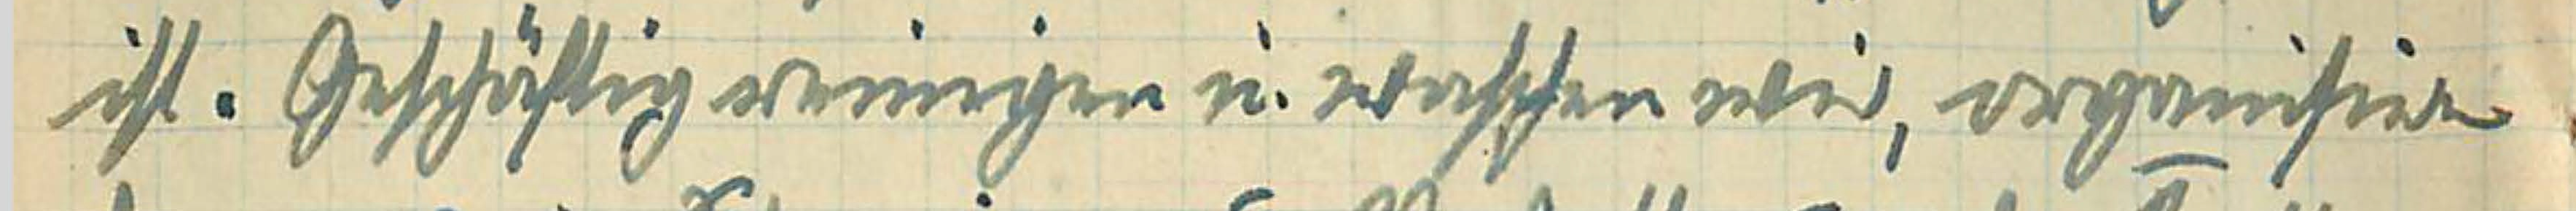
ist. Geschäftig reinigen u. waschen wir, organisieren
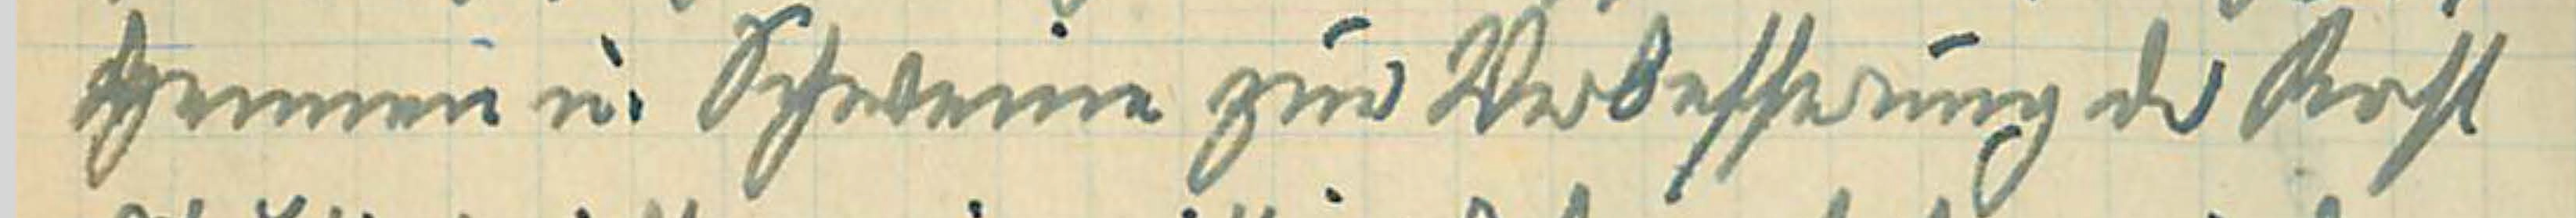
Hennen u. Schweine zur Verbesserung der Kost
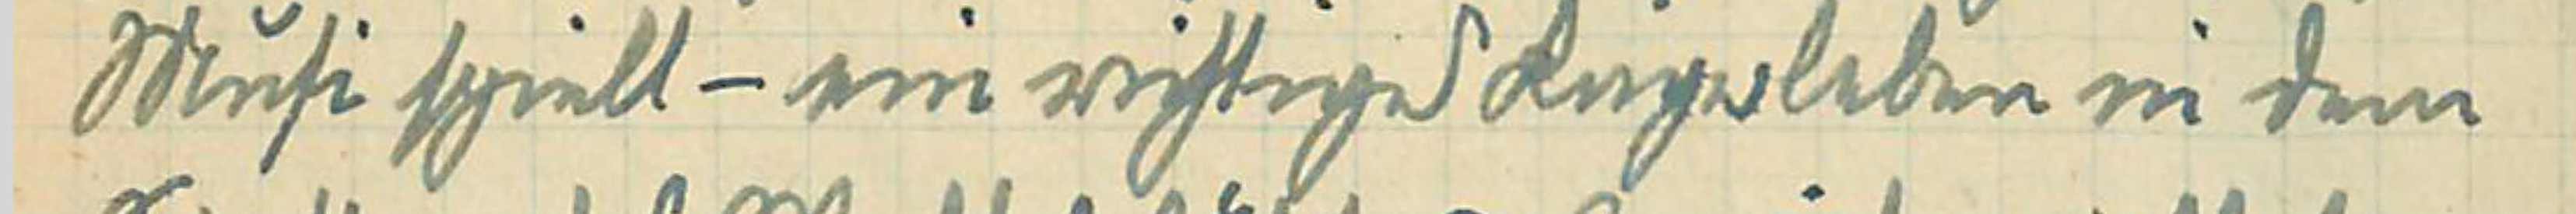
Musi spielt – ein richtiges Lagerleben in dem
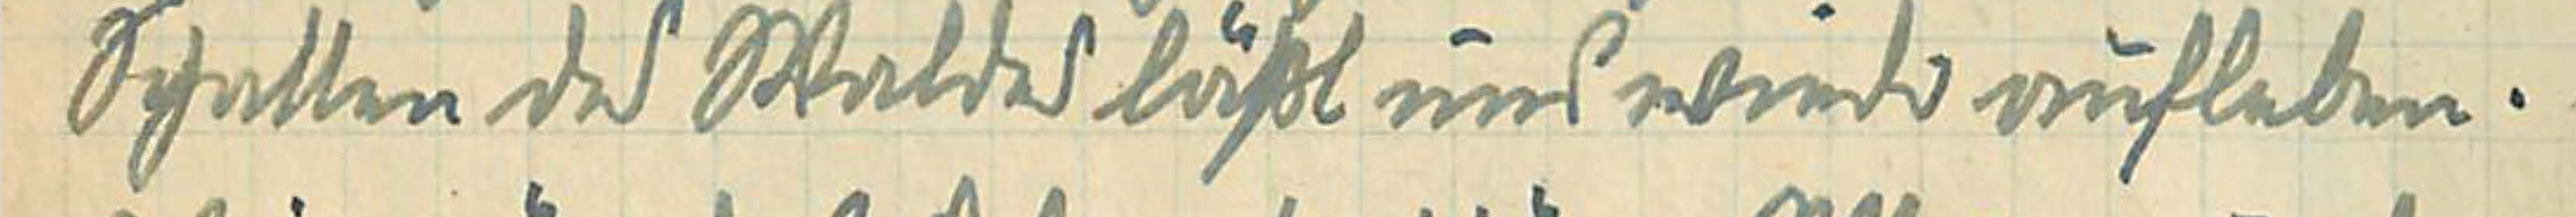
Schatten des Waldes läßt uns wieder aufleben.
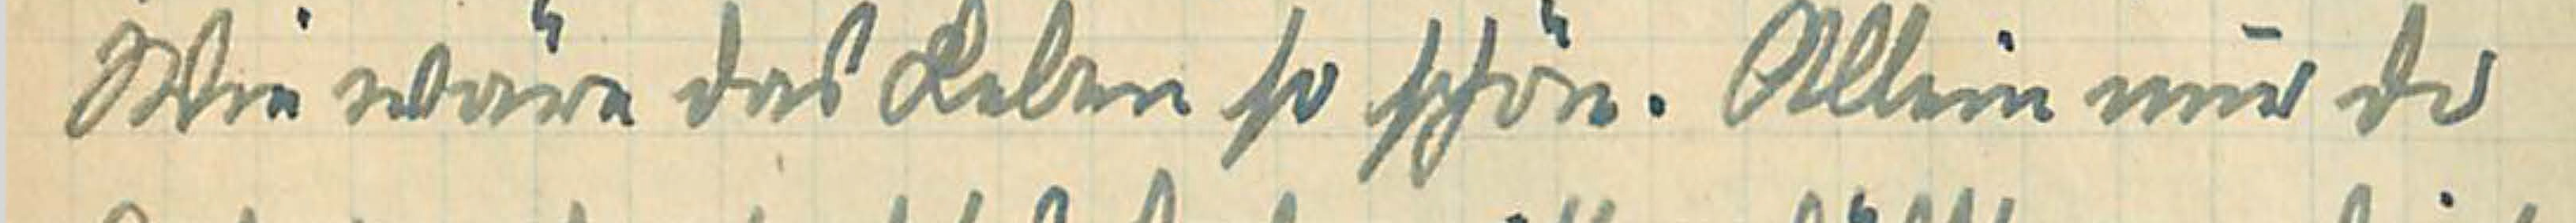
Wie wäre das Leben so schön. Allein nur der
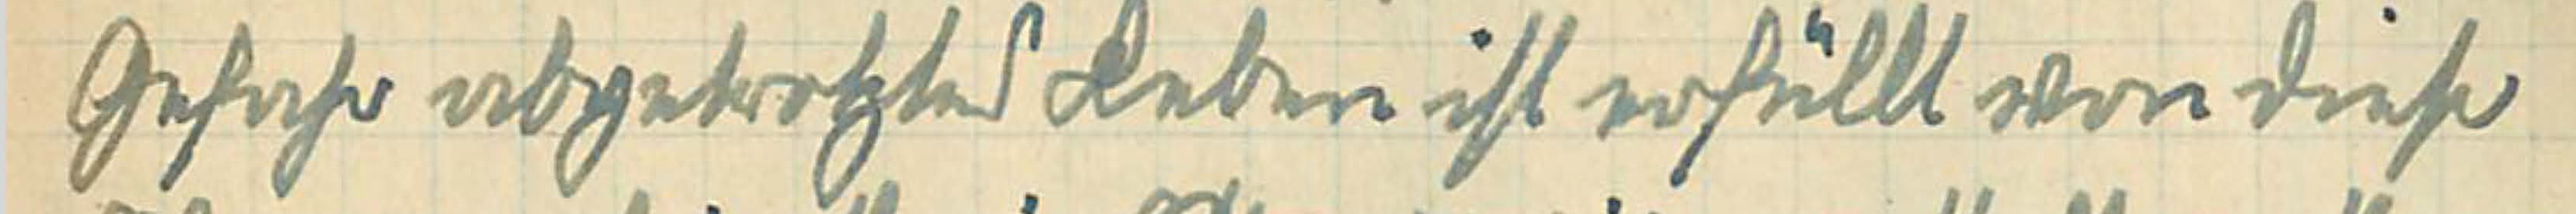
Gefahr abgetrotztes Leben ist erfüllt von dieser
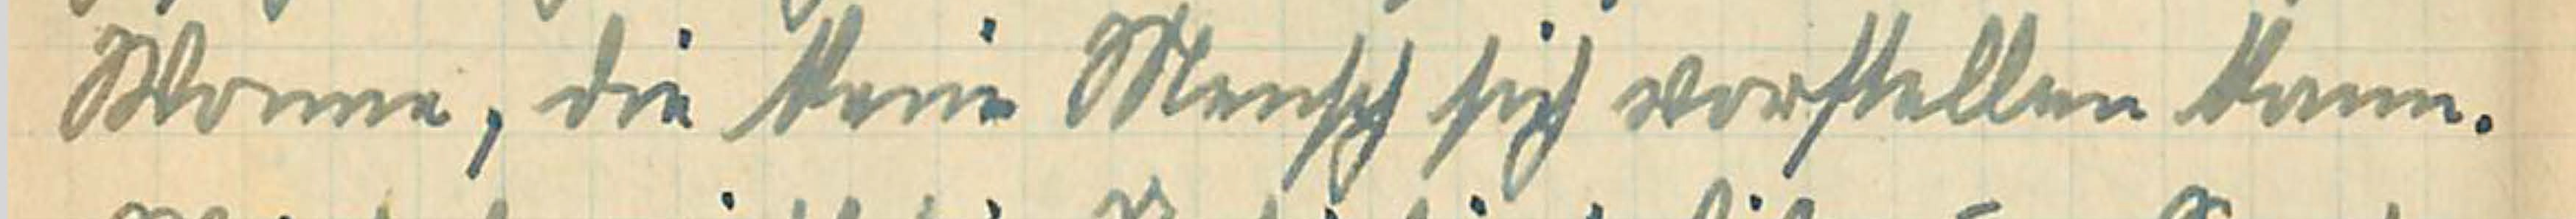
Wonne, die kein Mensch sich vorstellen kann.
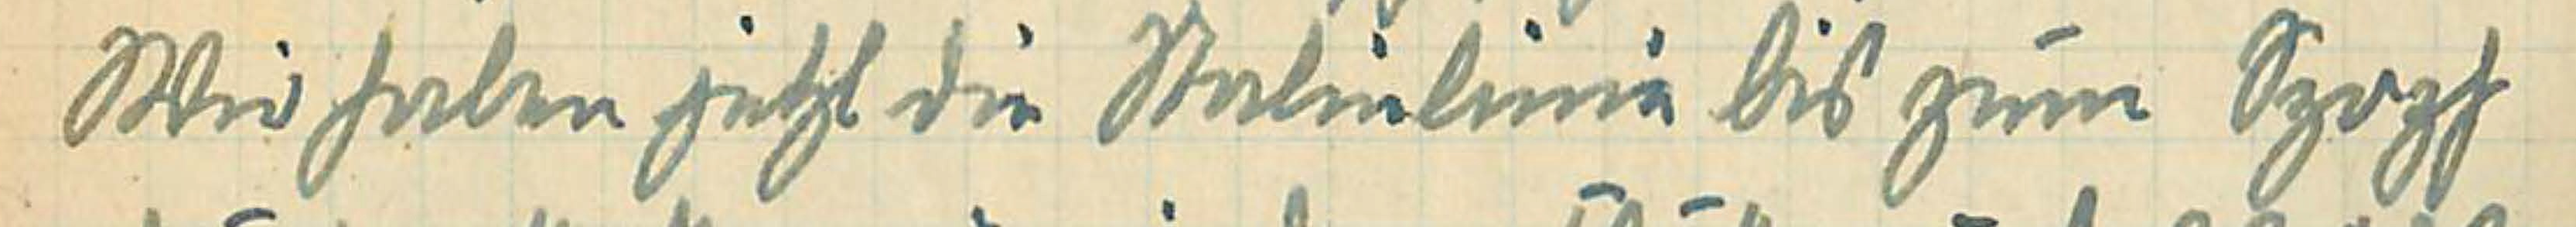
Wir haben jetzt die Stalinlinie bis zum Szozh
